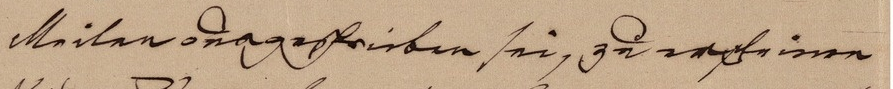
Meilen ausgeschrieben sei, zu erscheinen
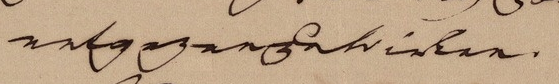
entgegenzuwirken.
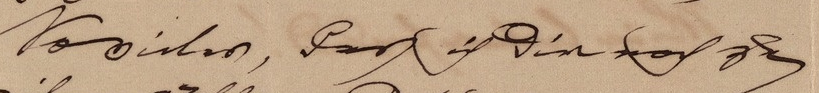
So vieles, das ich Dir noch zu
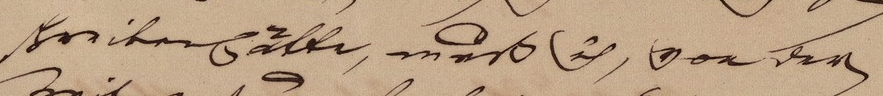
schreiben hätte, muß ich, von der
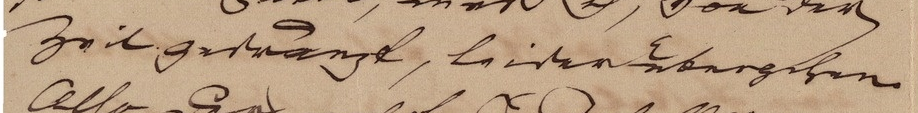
Zeit gedrängt, leider übergehen.
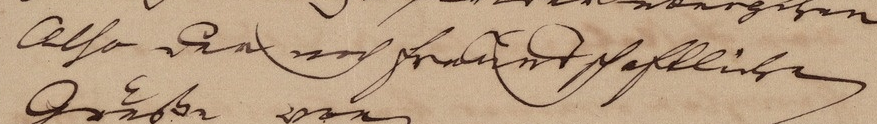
Also nur noch freundschaftliche
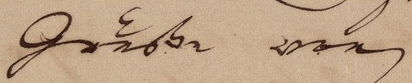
Grüße von
